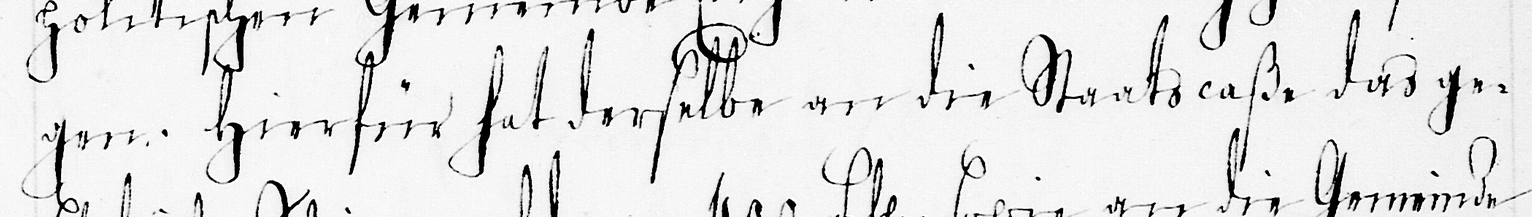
gen. Hierfür hat derselbe an die Staatscaße das ge¬
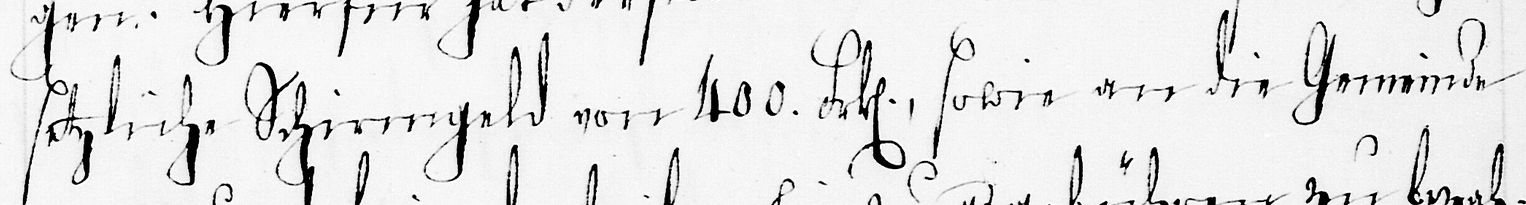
setzliche Schirmgeld von 400. Frk[en]., sowie an die Gemeinde
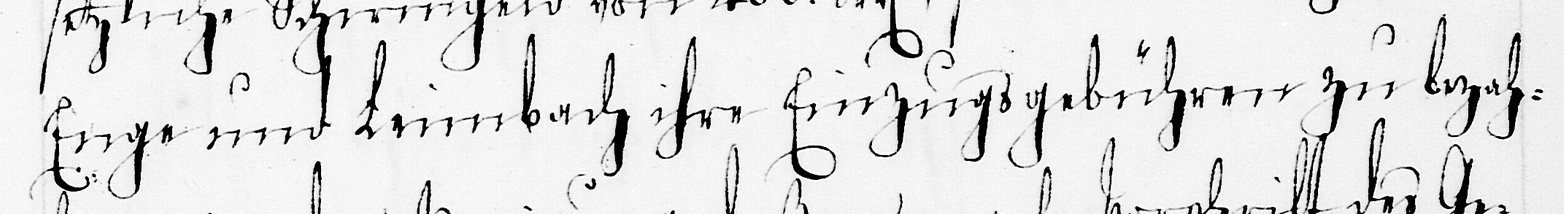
Enge und Leimbach ihre Einzugsgebühren zu bezah¬
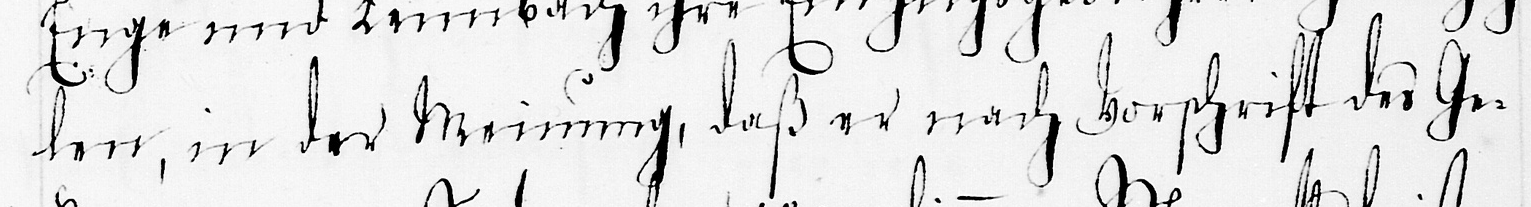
len, in der Meinung, daß er nach Vorschrift des Ge¬
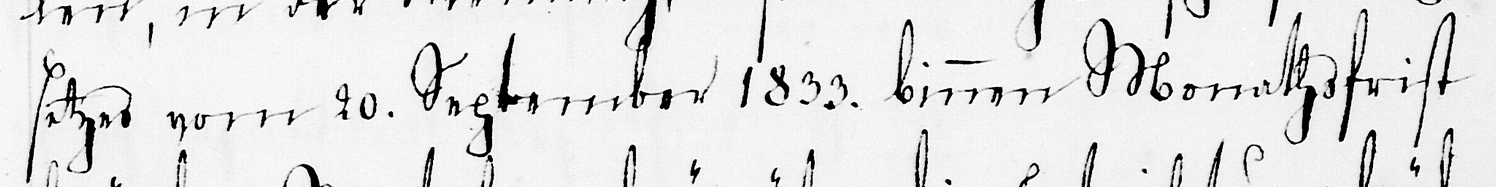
setzes vom 20. September 1833. binnen Monathsfrist
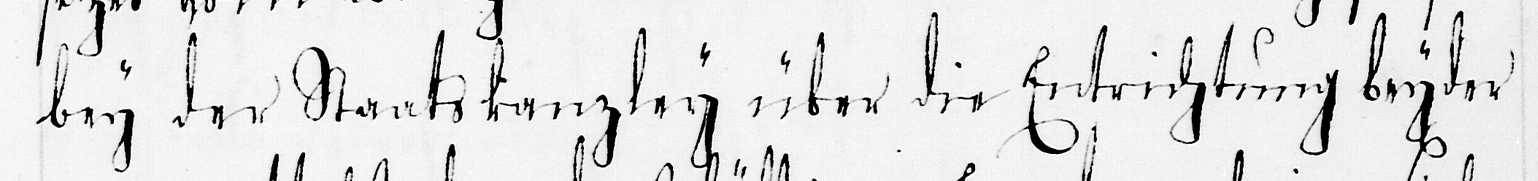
bey der Staatskanzley über die Entrichtung beyder
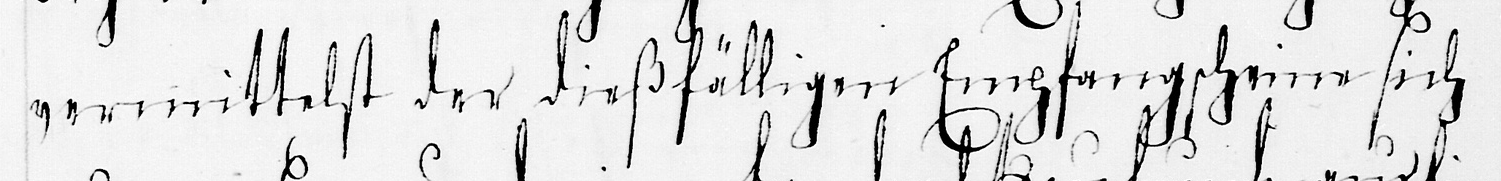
vermittelst der dießfälligen Empfangscheine sich
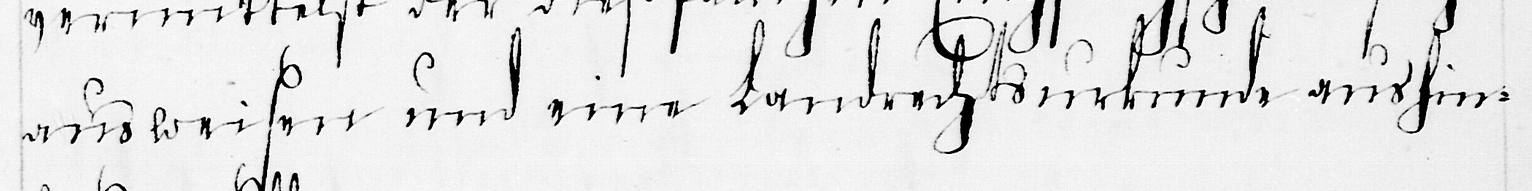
ausweisen und eine Landrechtsurkunde aushin¬
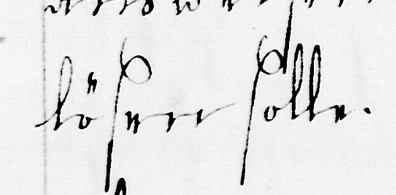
lösen solle.
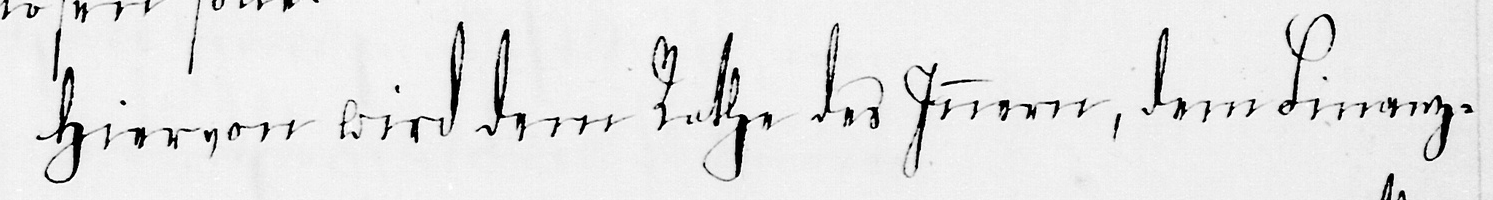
Hiervon wird dem Rathe des Innern, dem Finanz-
